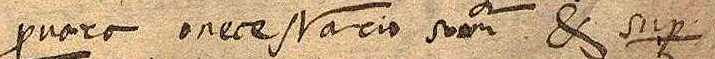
ꝓuara o necessario soomte & suꝑ
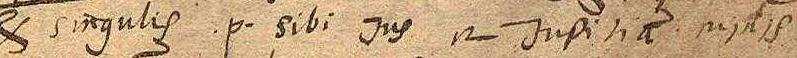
& singulis p. sibi jus et Justitiā mjnjs
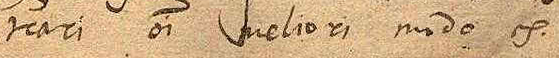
trari ōi meliori modo cꝭ.
